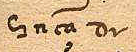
Snçā de
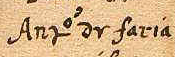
Anto de faria
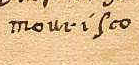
mourisco
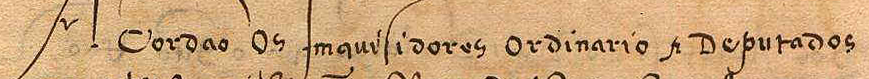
Acordão os Jmquisidores ordinario e Deputados
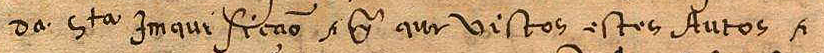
da Sta Jmquisiçaõ e c̄ꝭ que Vistos estes Autos e
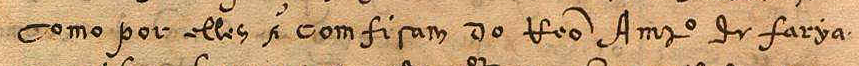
Como por elles e comfisam do Rēo Amto de farya
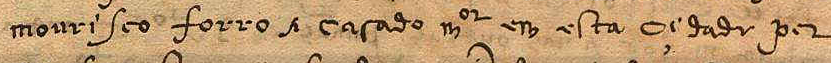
mourisco forro e casado mor em esta cidade per
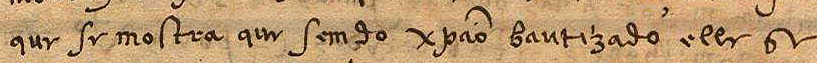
que se mostra que semdo xpão bautizado elle se
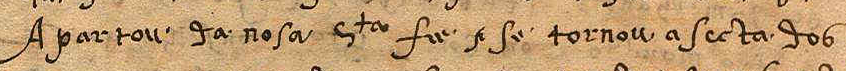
Apartou da nosa Sta fee e se tornou a secta dos
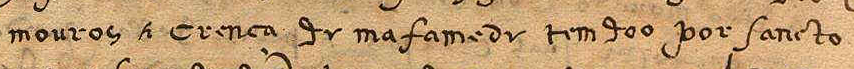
mouros e crença de mafamede temdoo por sancto
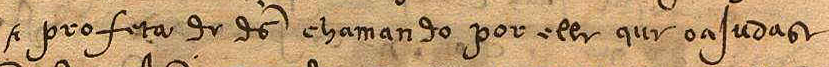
e profeta de ds̄ chamando por elle que o aJudase
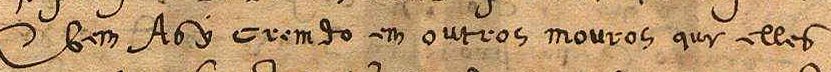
e bem Asy cremdo em outros mouros que elles
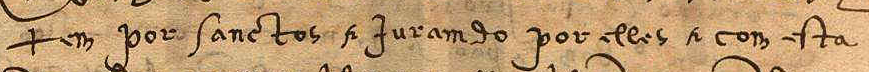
tem por Sanctos e Juramdo por elles e com esta
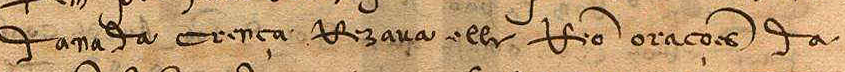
danada crença Rezaua elle Rēo orações da
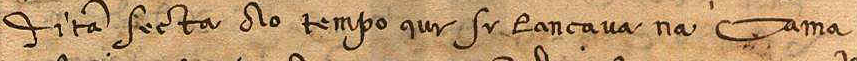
ditā secta Ao tempo que Se lançaua na Cama
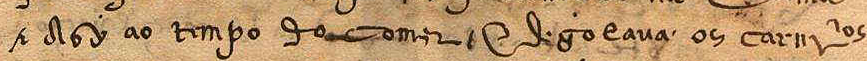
e Asy ao tempo do comer / e degolaua os carnros
